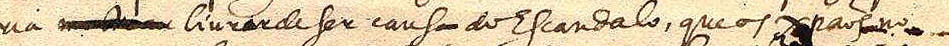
ria mostrar liurar de ser causa do Escandalo, que os xpaõs no
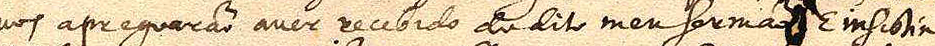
uos apregoaraõ auer recebido do dito meu sermaõ E insistin
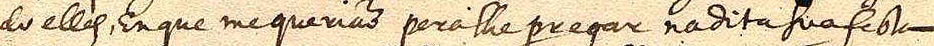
do elles, En que me querião pera lhe pregar na dita sua festa
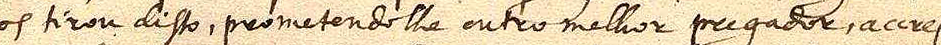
os tirou disso, prometendolhe outro melhor pregador, accres
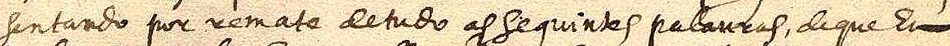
sentando por remate de tudo as seguintes palauras, de que Eu
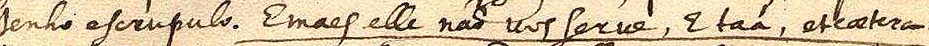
tenho escrupulo. E maes elle naõ uos serue, E taá, et cœtera
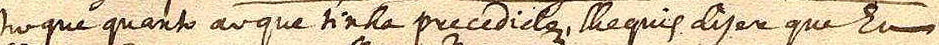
No que quanto ao que tinha precedido, lhe quis dizer que Eu
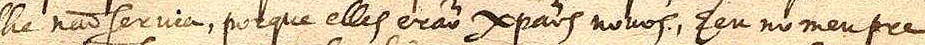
lhe não seruia, porque elles eraõ Xpaõs nouos, E eu no meu pre
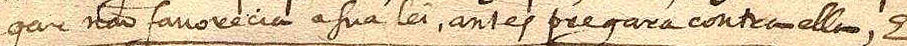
gar não fauorecia a sua lei, antes pregara contra ella, E
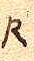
R
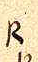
R
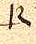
R
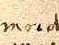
in re do
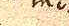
mus
